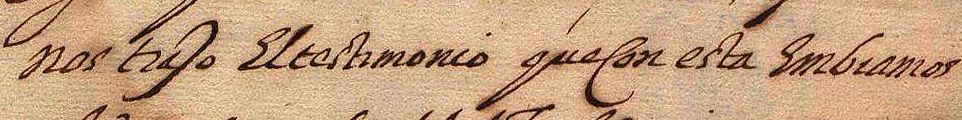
nos traJo El testimonio que Con esta Embiamos
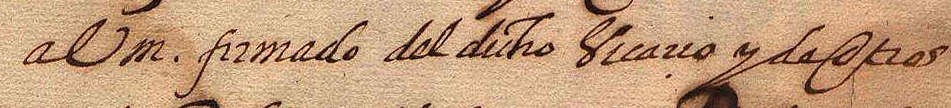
a Vm. firmado del dicho Vicario y de otros
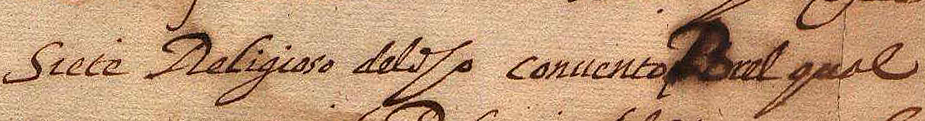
Siete Religioso del dho conuento _rel qual
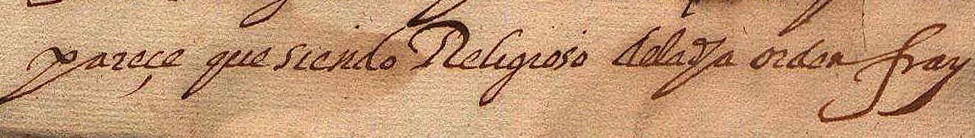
parece que siendo Religioso de la dha orden fray
